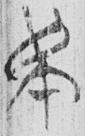民
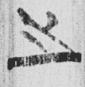之
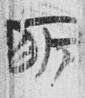所
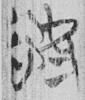欲
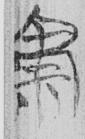○（鬼）
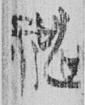神
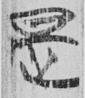是
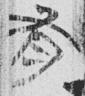有（祐）
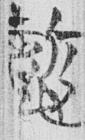○（慎）
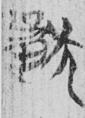獸（守）
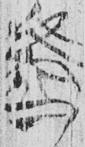虛
